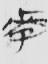李
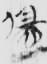偳
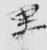里
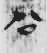公
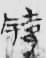隋
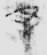○（得）
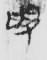受
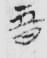○（期）
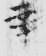辛
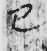巳
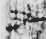之
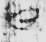日
